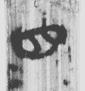四
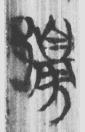{邑自旁}
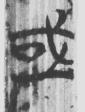或
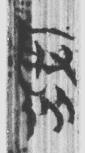聚
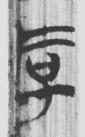厚
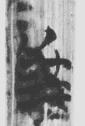爲
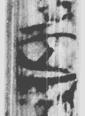正
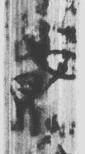貣
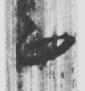㠯（以）
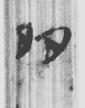多
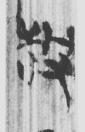{告攴}
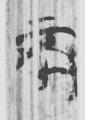不
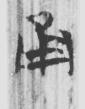甬
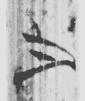之
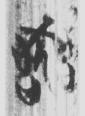器
